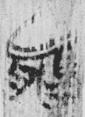能
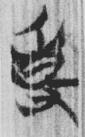事
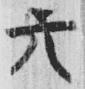亓（其）
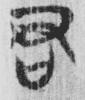君
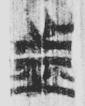者
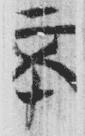不
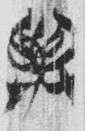與
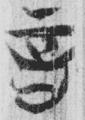言
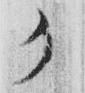人
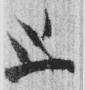之
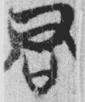君
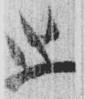之
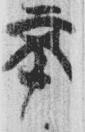不
